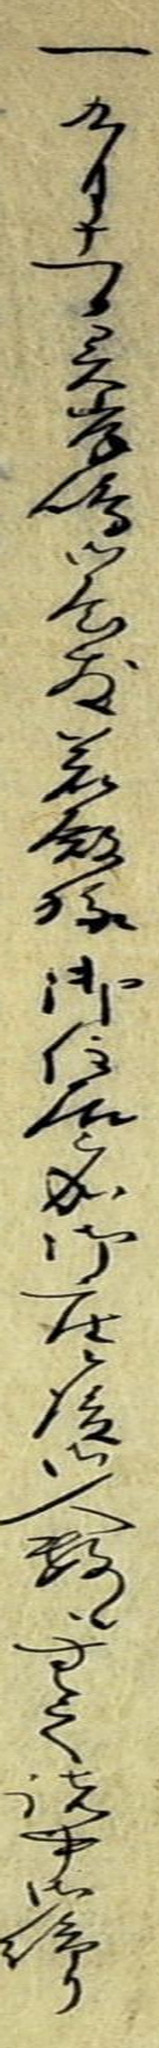一九月十一日霊岸嶋御屋敷若殿様御住居被成御座候後御人数も無之諸事御締り
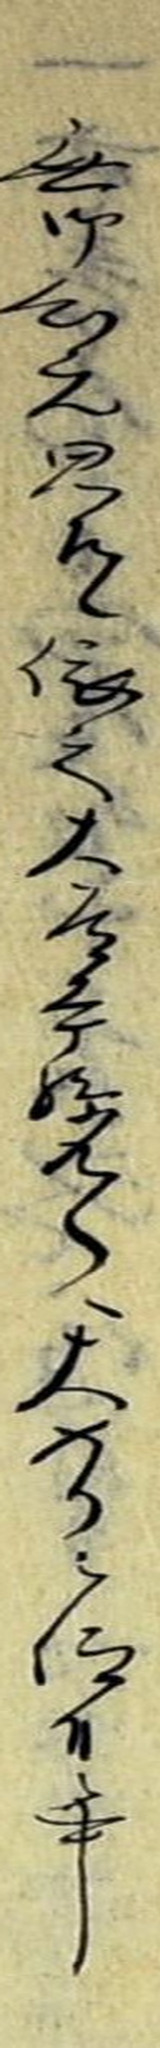無御心元思召候依之大道寺孫九郎へ右〆り被仰付候事
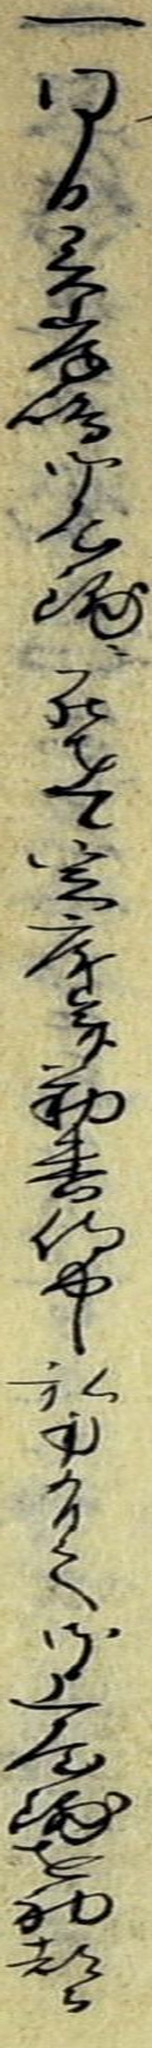一同日霊岸嶋御屋鋪ニ罷在候定府并勤番侍中私用有之御上屋鋪を初都而
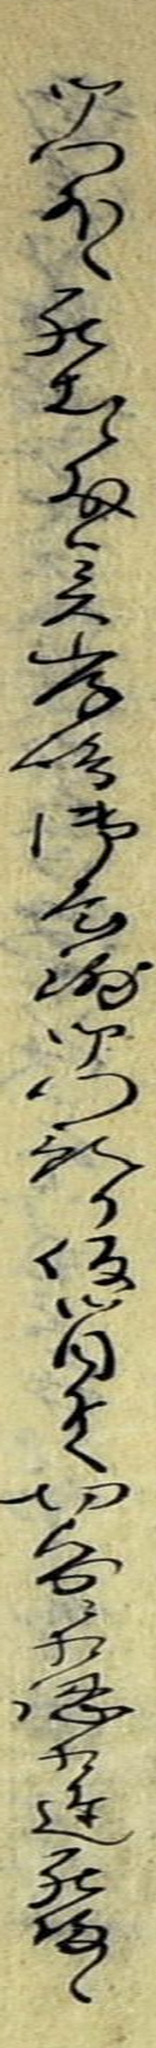御門外へ罷出候義は霊岸嶋御屋鋪御門預り仮御目付へ切紙ニ相認相達罷帰候

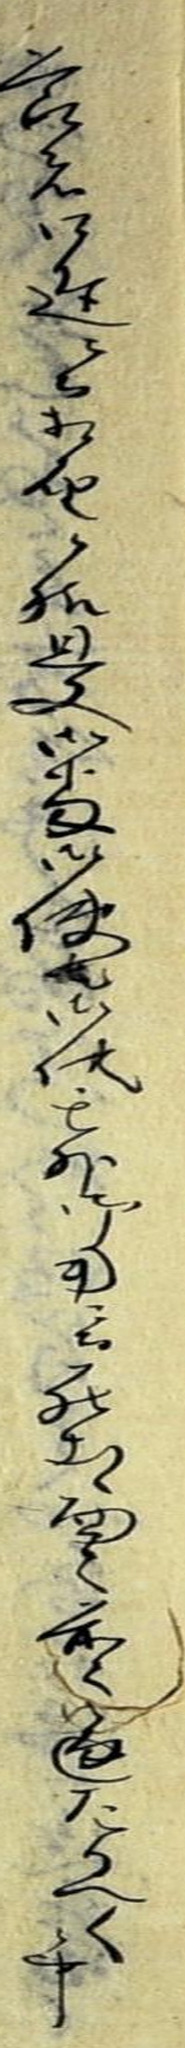節者口達ニ而相届候様且又御番御使者御供其外御用ニ而罷出候面々前々之通たるへく候事
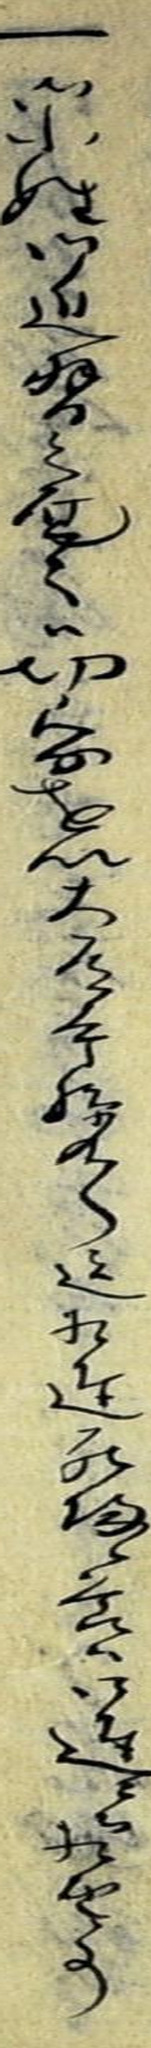一御小姓御近習之面々ハ切紙を以大道寺孫九郎迄相達罷帰候節ハ口達ニ而相届候事
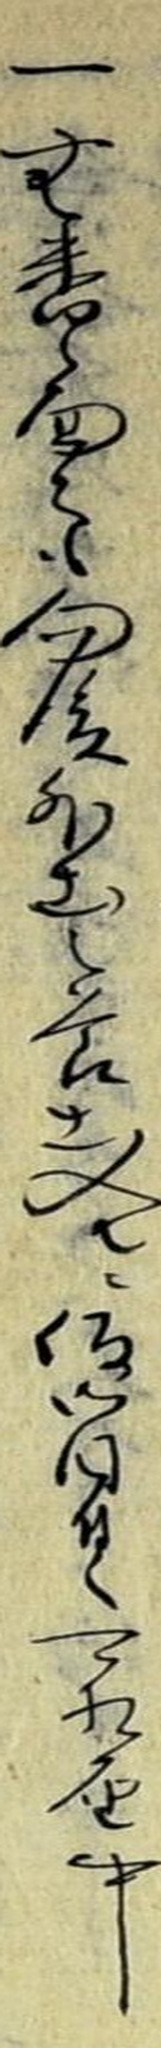一無番之面々も向後外出之節出入共ニ仮御目付へ可相届事
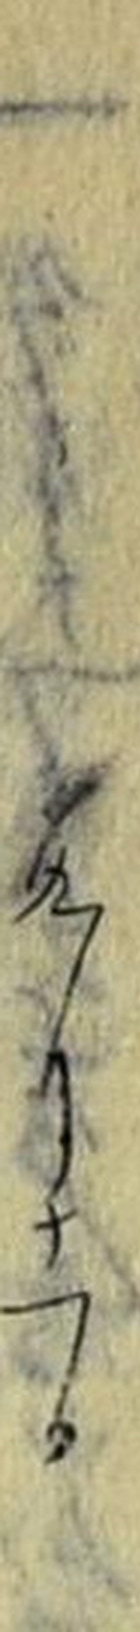九月十一日
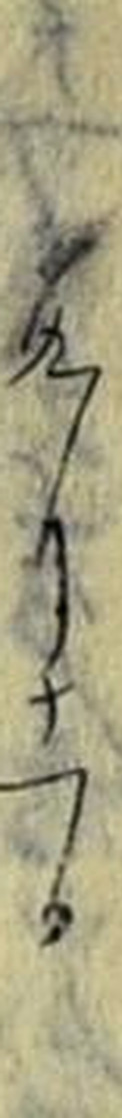九月十一日
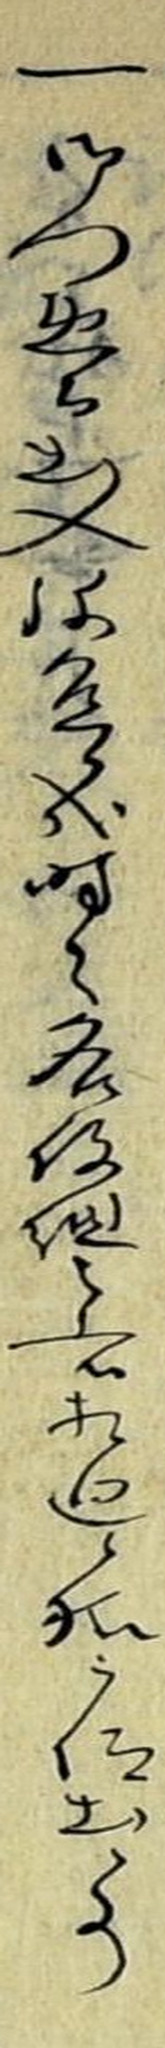一御門惣而出入弥宜候哉時々各役組之者相廻候様被仰出候事
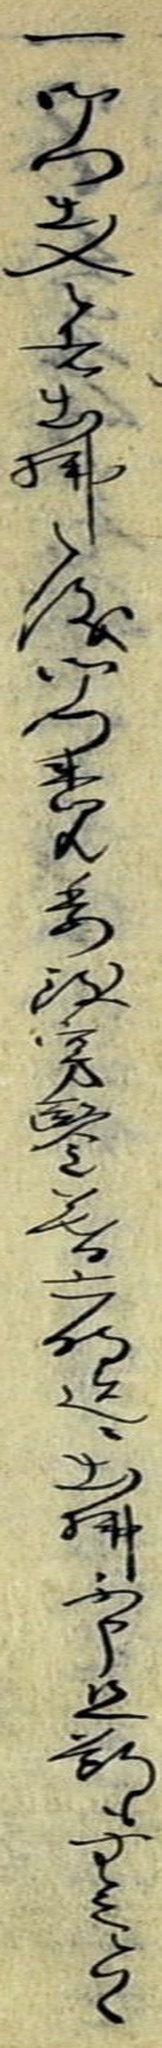一御門出入之者出払之儀御門番共委致穿鑿暮六時迄ニ出払不申且断も無之候ハヽ
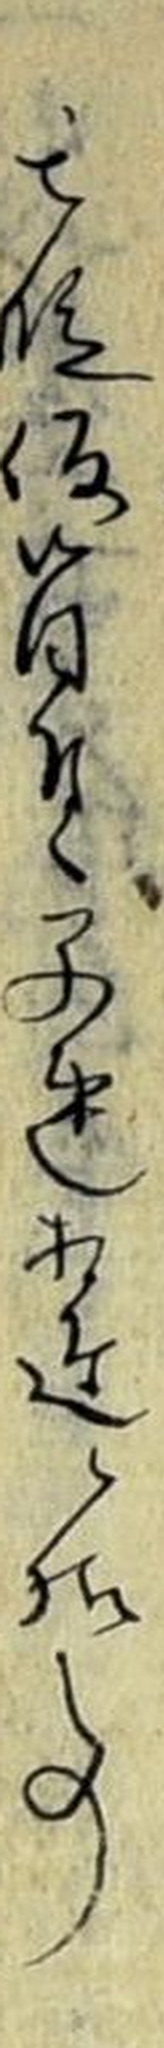其段仮御目付へ早速相達候様事
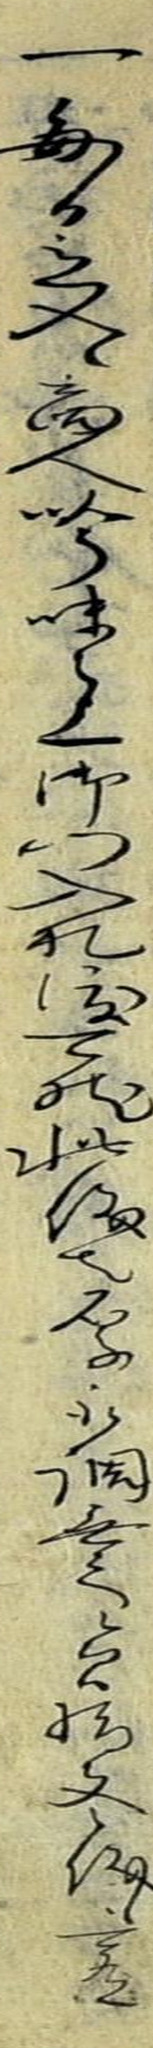一毎日立入候商人吟味之上御門入札渡可然此儀者厚取調無之候而ハ指支候儀も可有
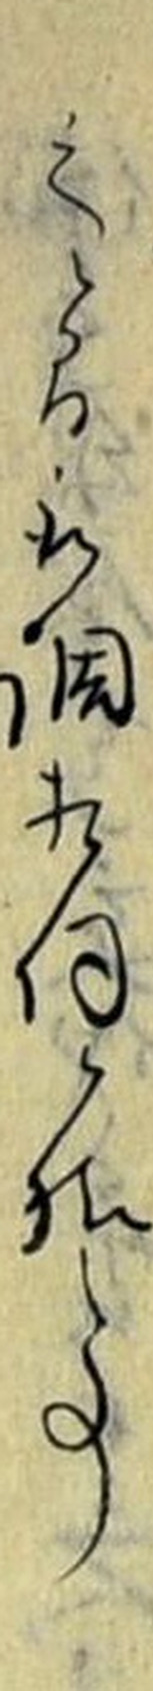之候間取調相伺候様之事
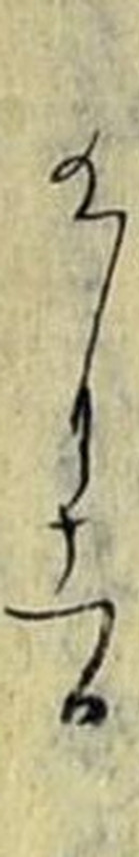九月十一日
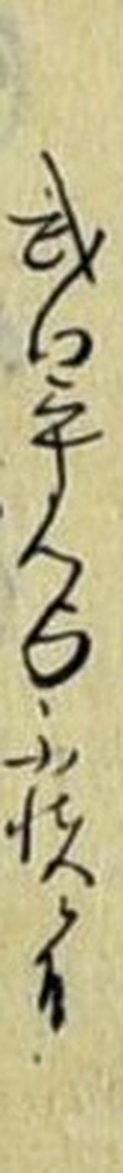武田平右衛門不快ニ付
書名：命令之部 三
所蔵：福井県文書館 Fukui Prefectural Archives
